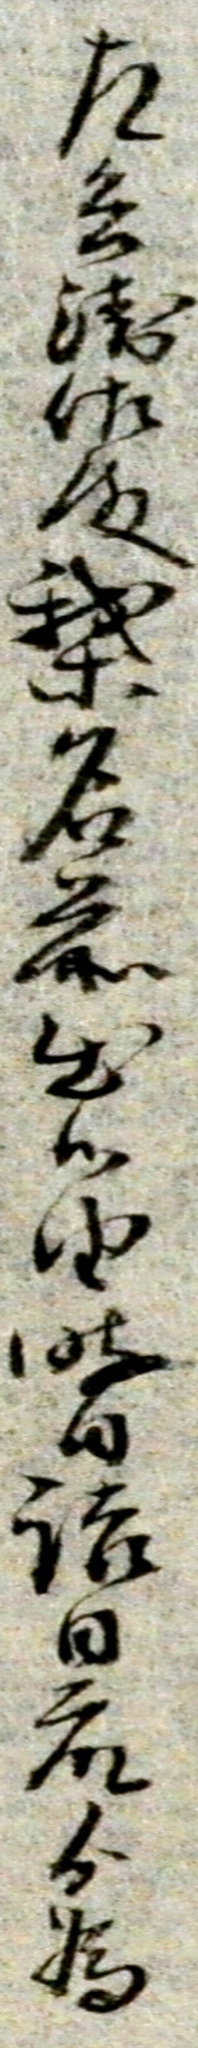左兵衛佐殿我等名前出候由昨日詰日衆ゟ為
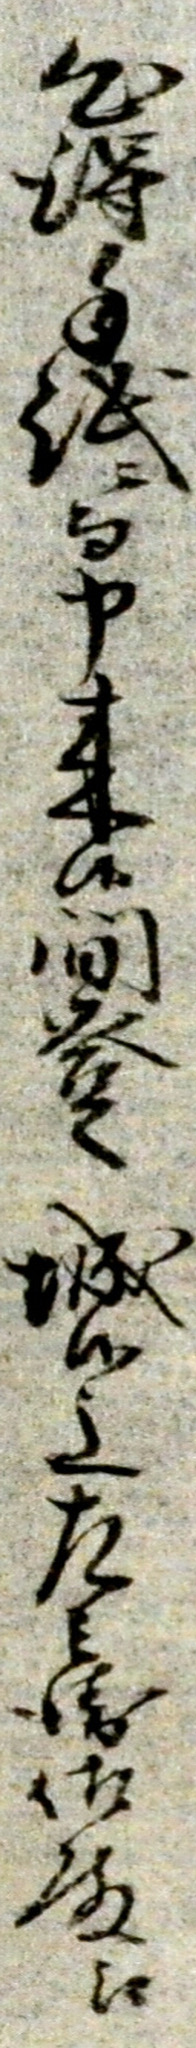心得手紙ニ而申来候間登城候上左兵衛佐殿え
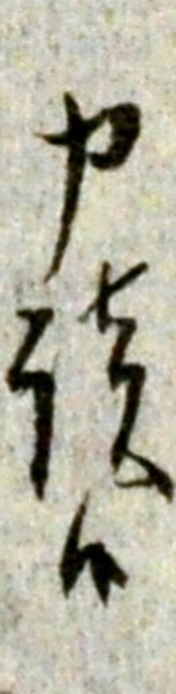申談候
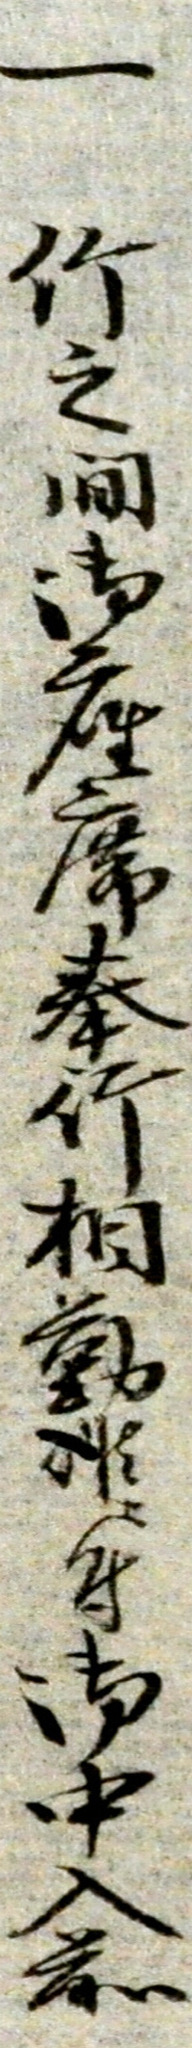一竹之間御座席奉行相勤候ニ付御中入前
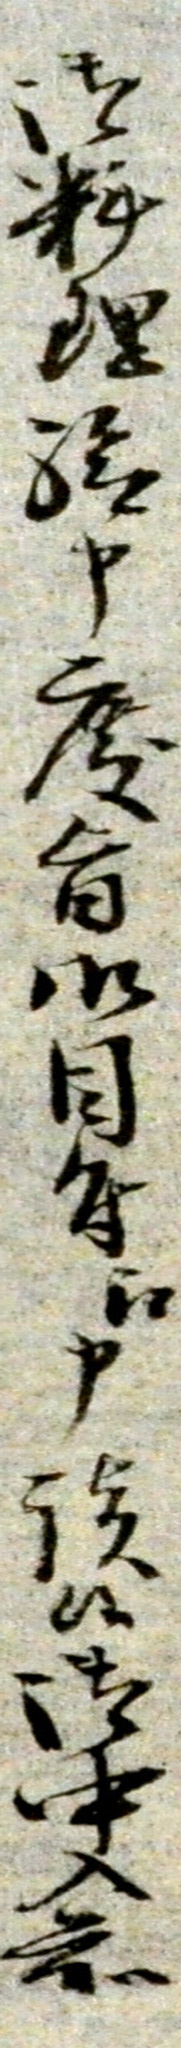御料理給申度旨御目付え申談候御中入前
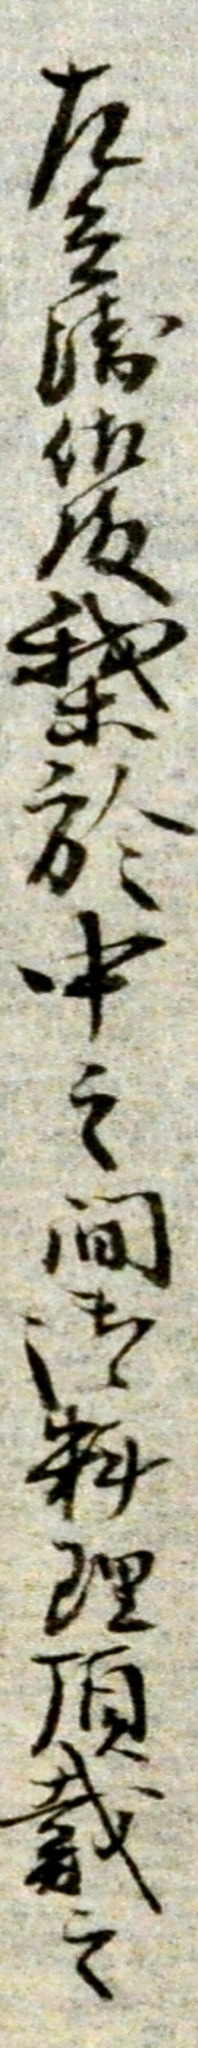左兵衛佐殿我等於中之間御料理頂戴候
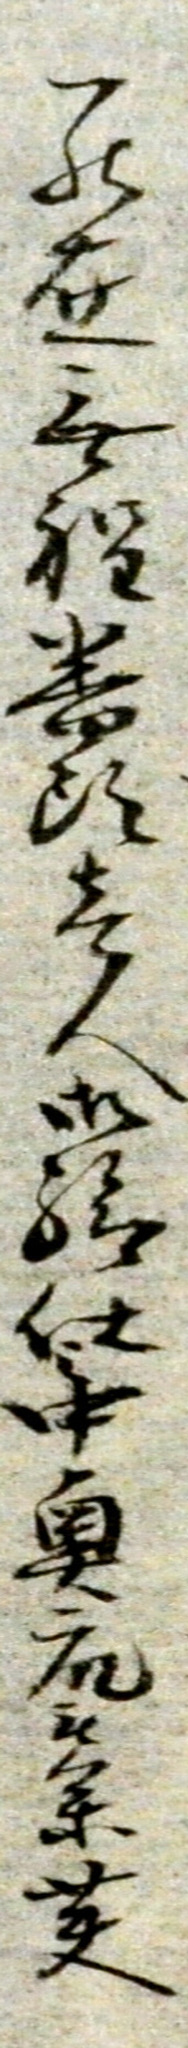罷在無程番頭壱人御給仕之中奥衆被参芙
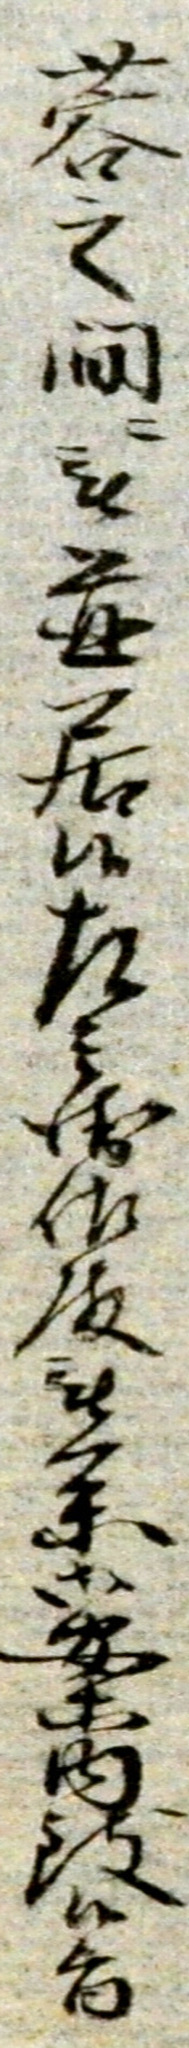蓉之間ニ被並居候左兵衛佐殿被参御案内致候旨
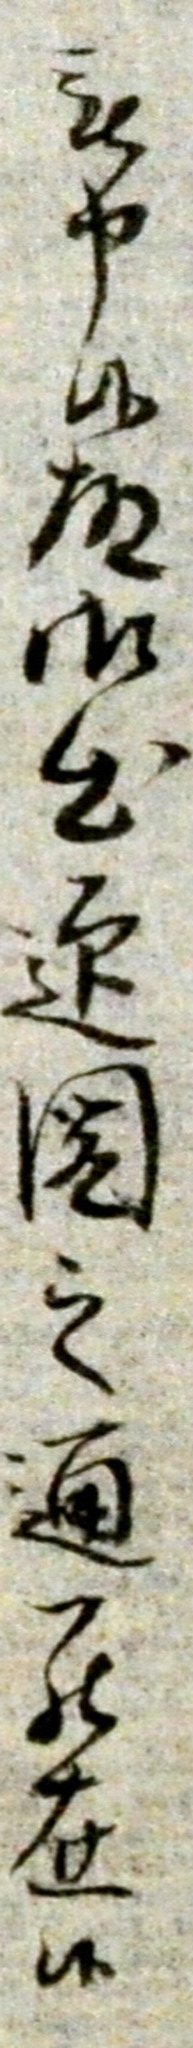被申候故御出迎圖之通罷在候

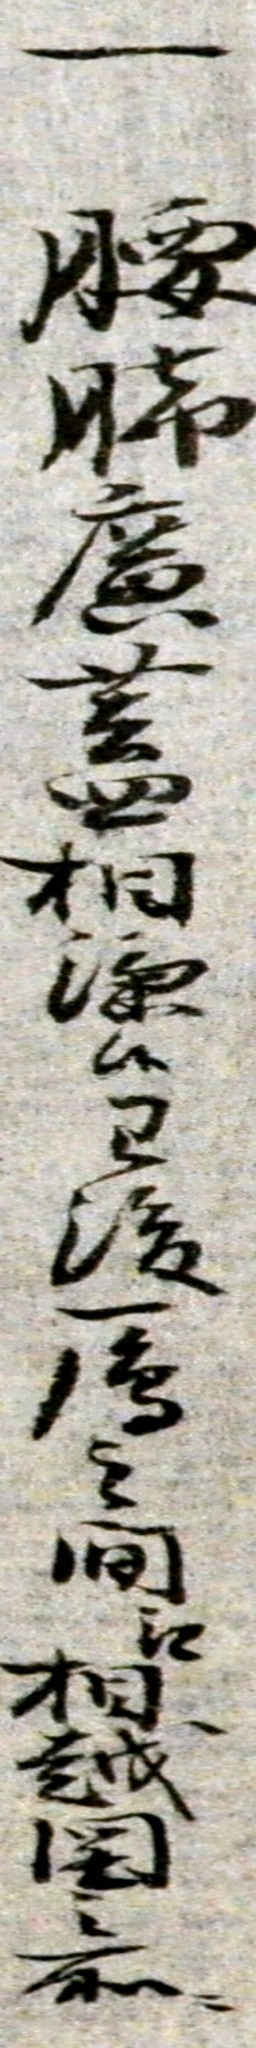一腰脚廣蓋相済候已後雁之間え相越圖之所ニ
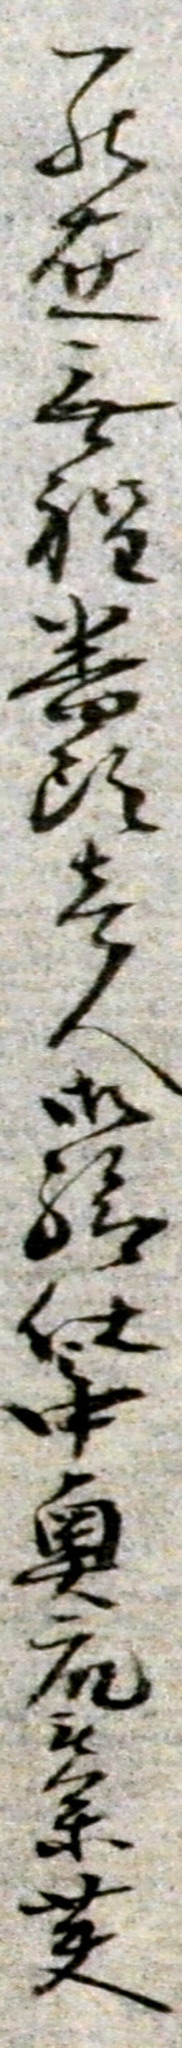罷在無程番頭壱人御給仕之中奥衆被参芙
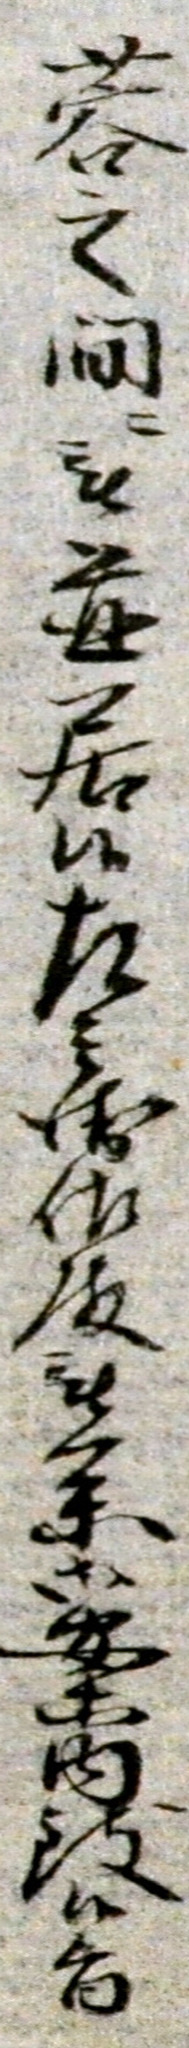蓉之間ニ被並居候左兵衛佐殿被参御案内致候旨
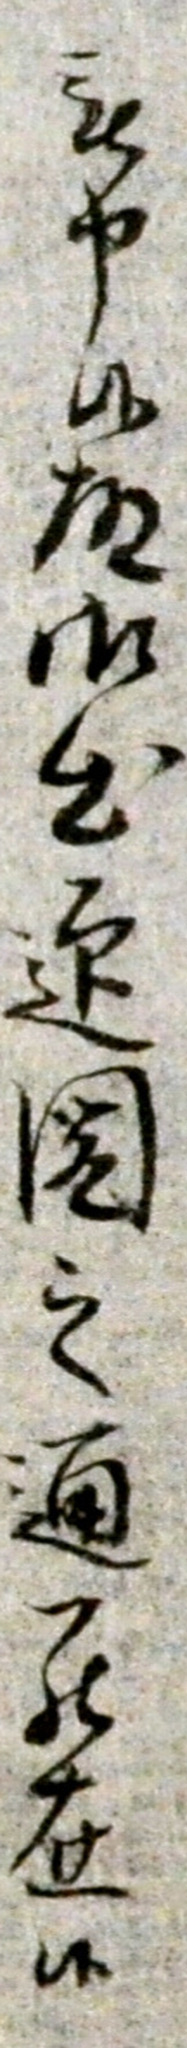被申候故御出迎圖之通罷在候
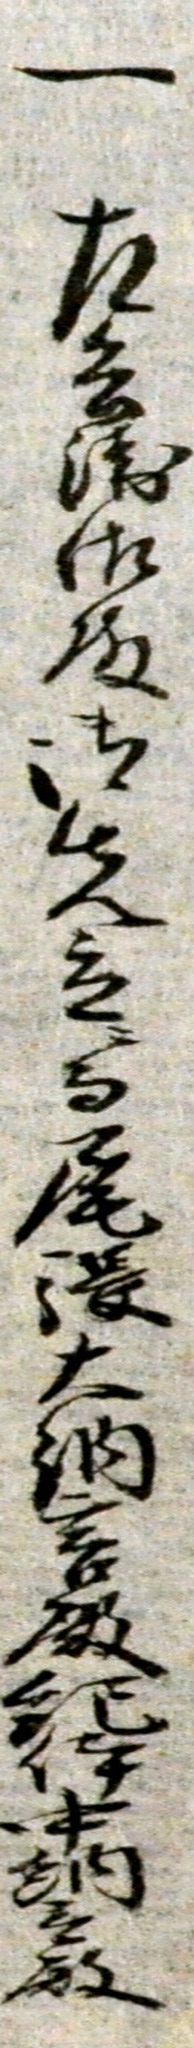一左兵衛佐殿御先立ニ而尾張大納言殿紀伊中納言殿
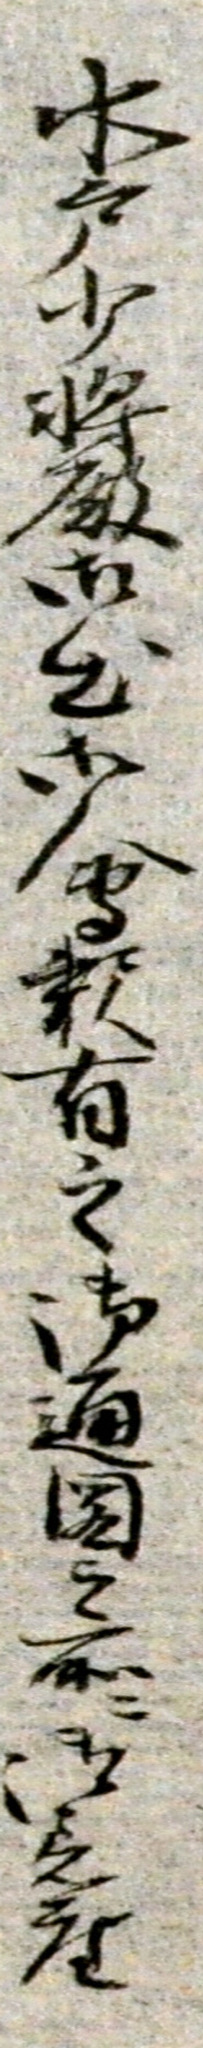水戸少将殿御出御會釈有之御通圖之所ニ御着座
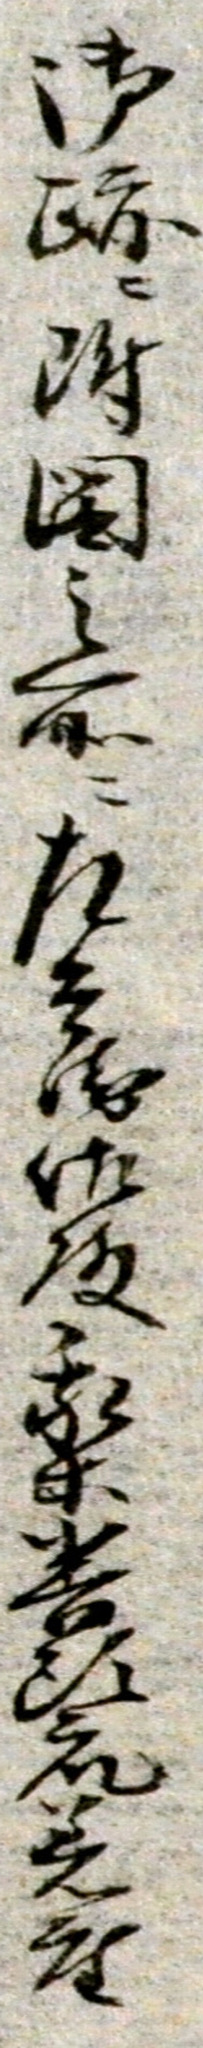御跡ニ附圖之所ニ左兵衛佐殿我等番頭衆着座
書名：竹ノ間御座席奉行勤方控外
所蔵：伊那市立高遠町図書館・合同会社AMANE
